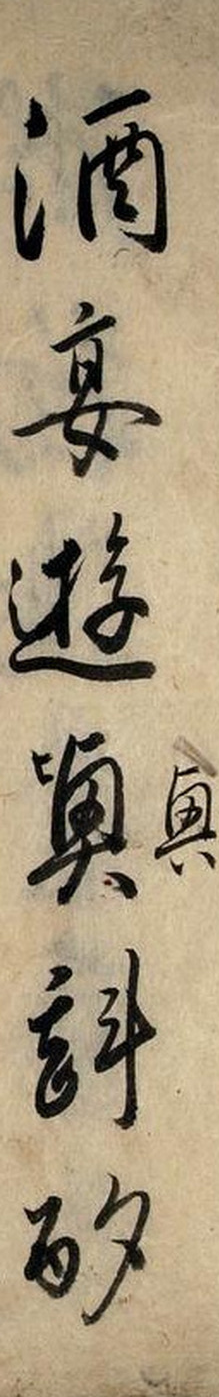酒宴遊斟酌
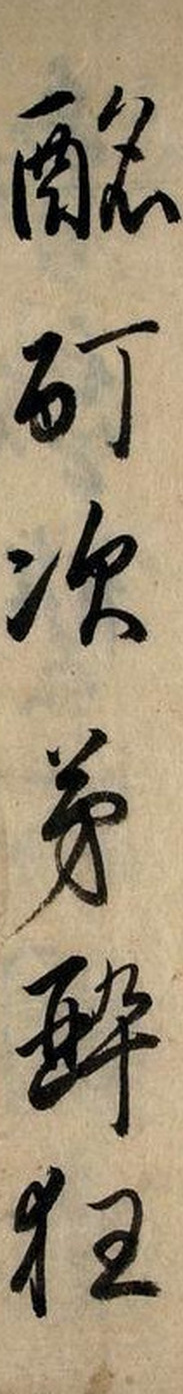酩酊次第酔狂
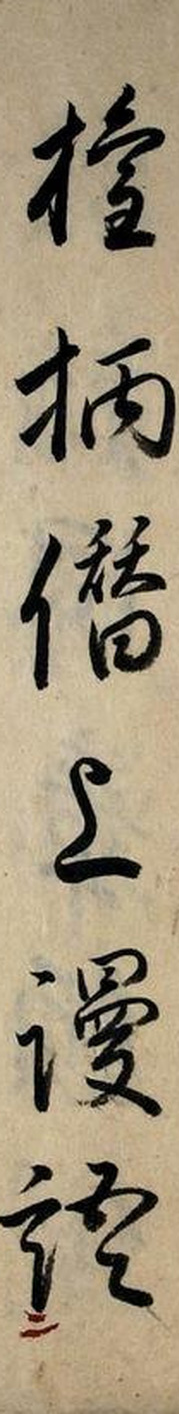権柄僭上漫語
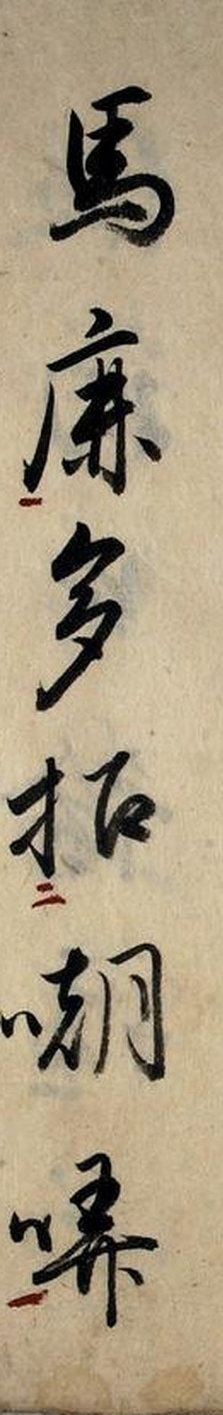馬鹿多招嘲哢

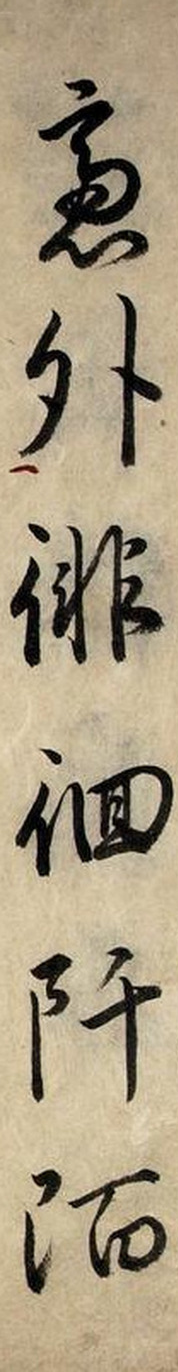慮外徘徊阡陌
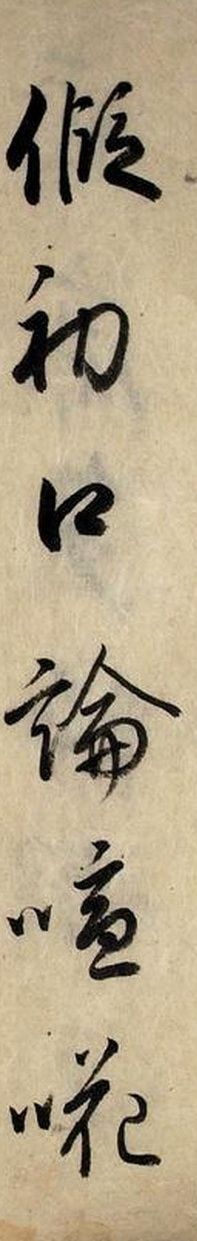仮初口論喧嘩
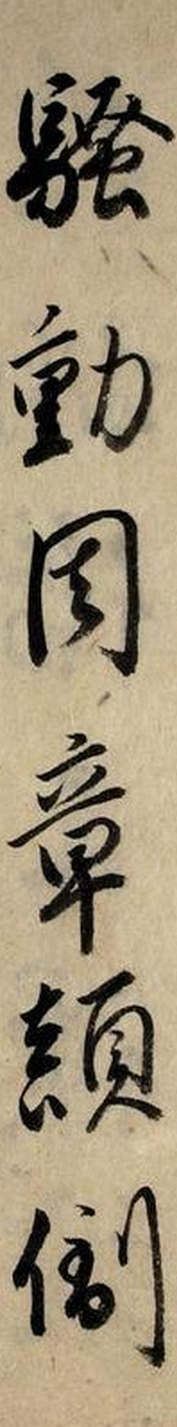騒動周章顛倒
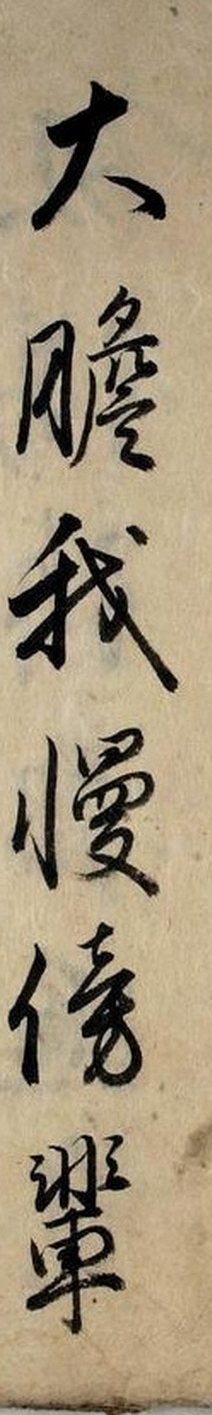大胆我慢傍輩
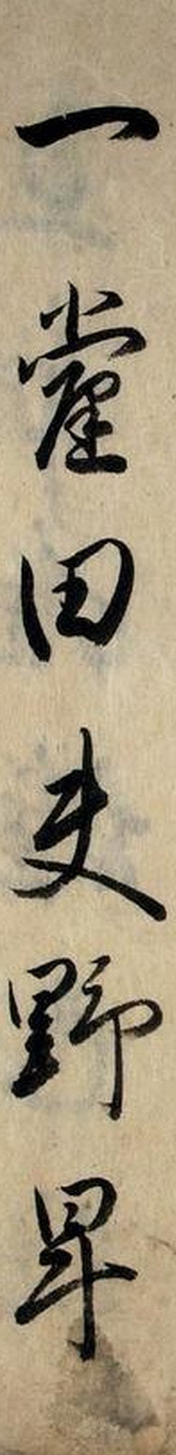一党田夫野卑
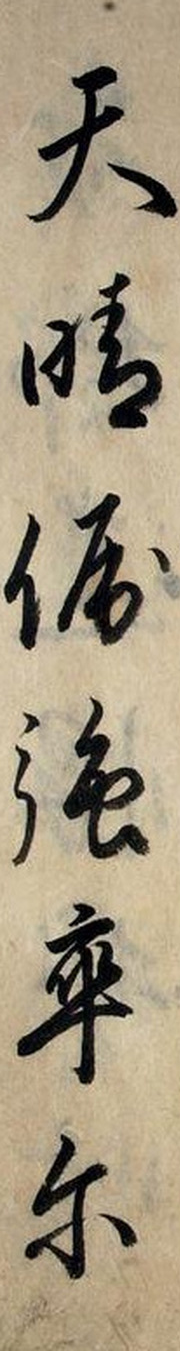天晴倔強卒爾

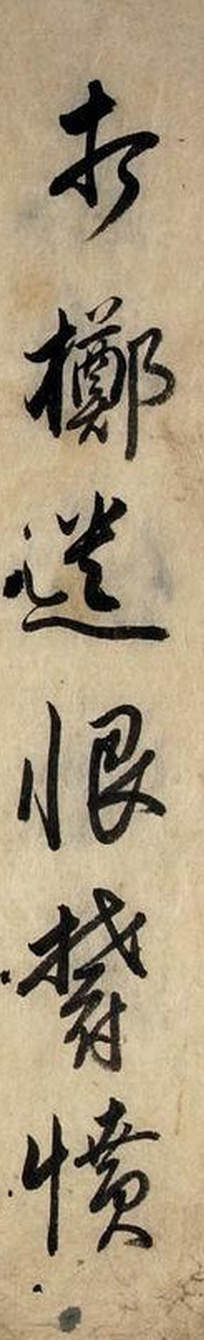打擲遺恨鬱憤
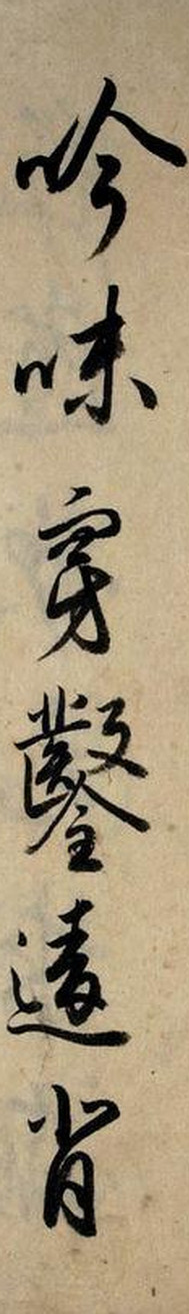吟味穿鑿違背
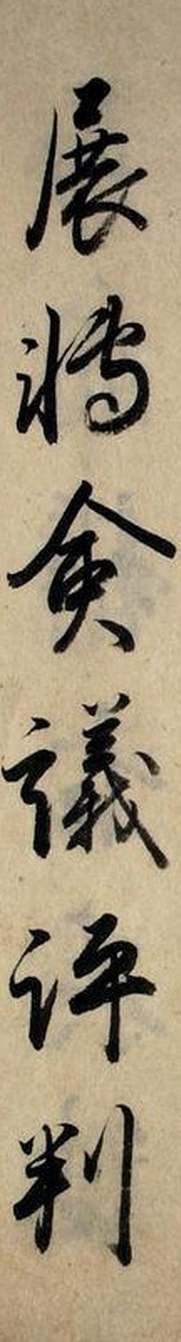展転僉議評判
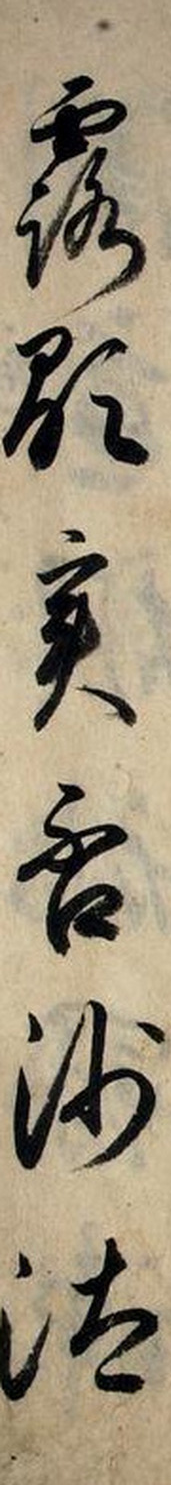露顕実否沙汰

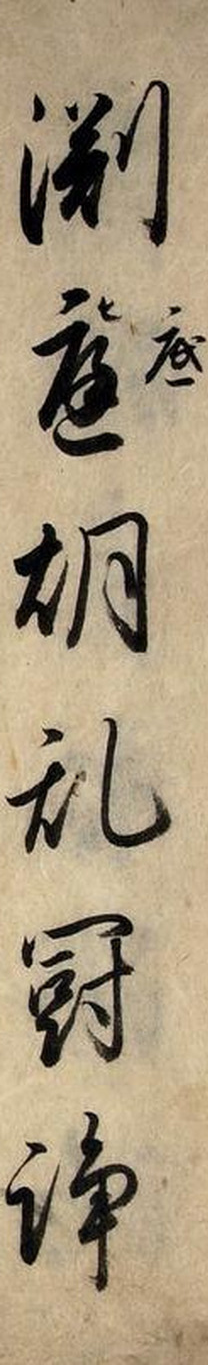渕庭胡乱闘諍
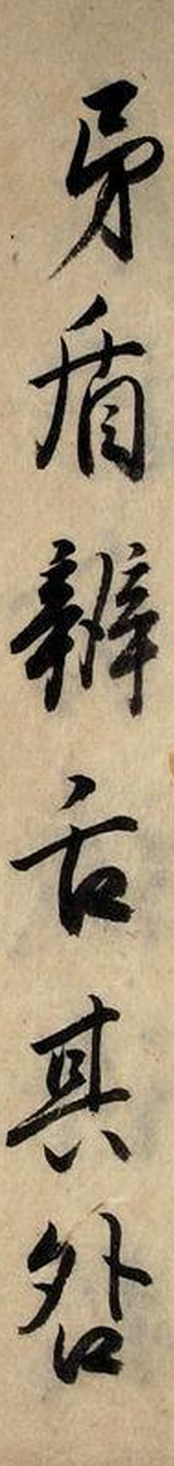矛盾弁舌其咎
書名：世話千字文（手習手本）
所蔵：福井県文書館 Fukui Prefectural Archives
